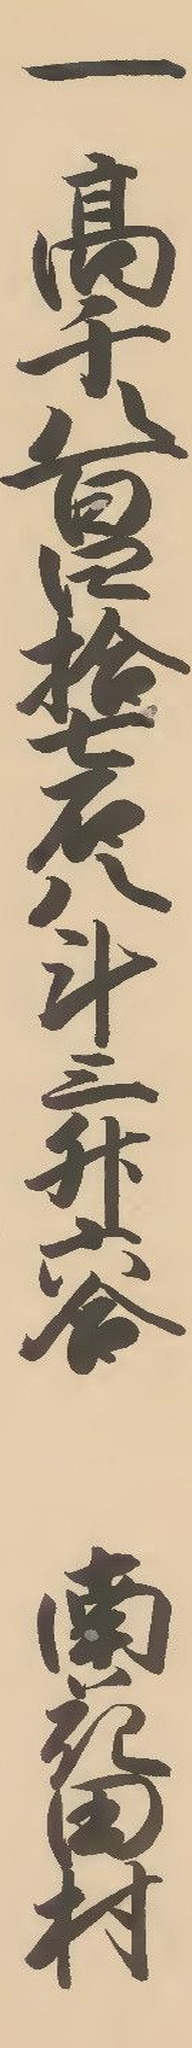一高千八百四拾七石八斗三升六合南花田村
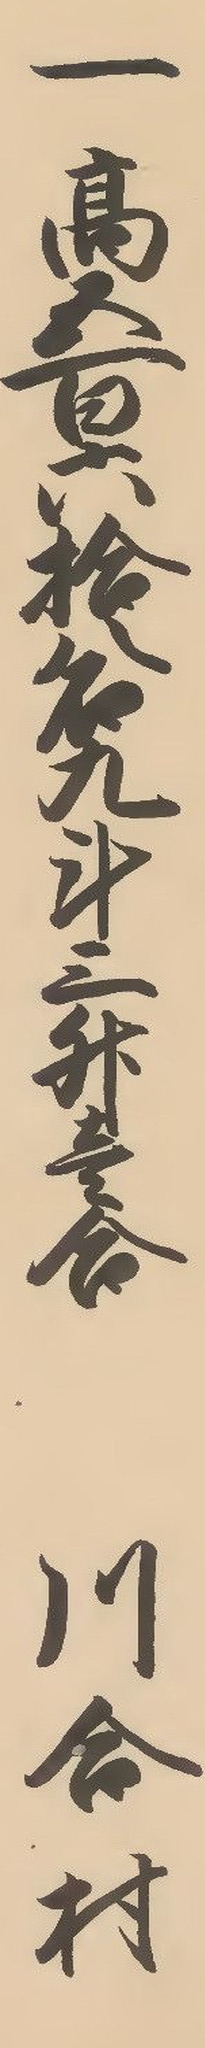一高五百六拾八石九斗三升壱合川合村
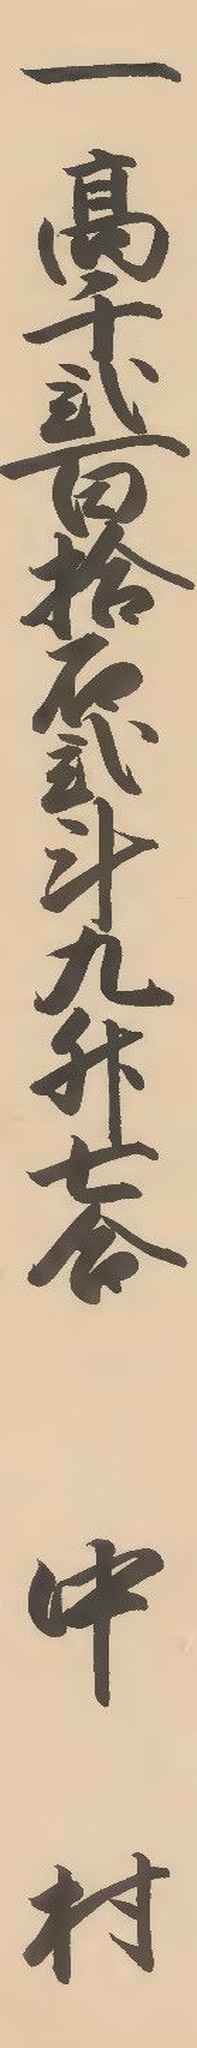一高千弐百拾石弐斗九升七合中村
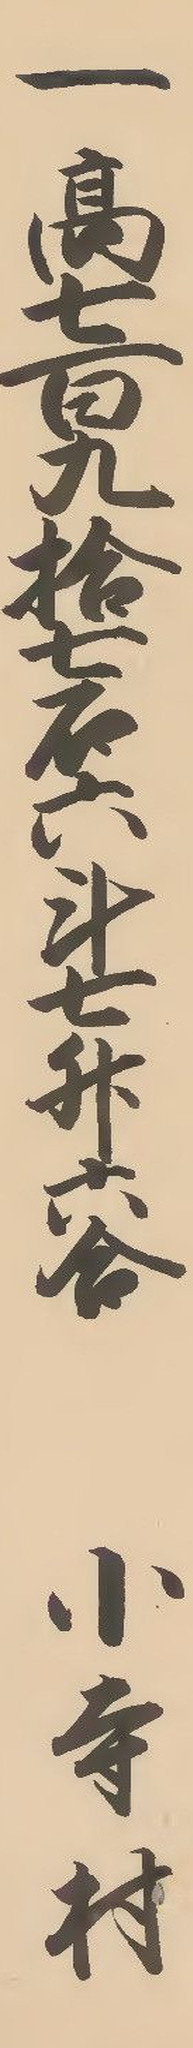一高七百九拾七石六斗七升六合小寺村
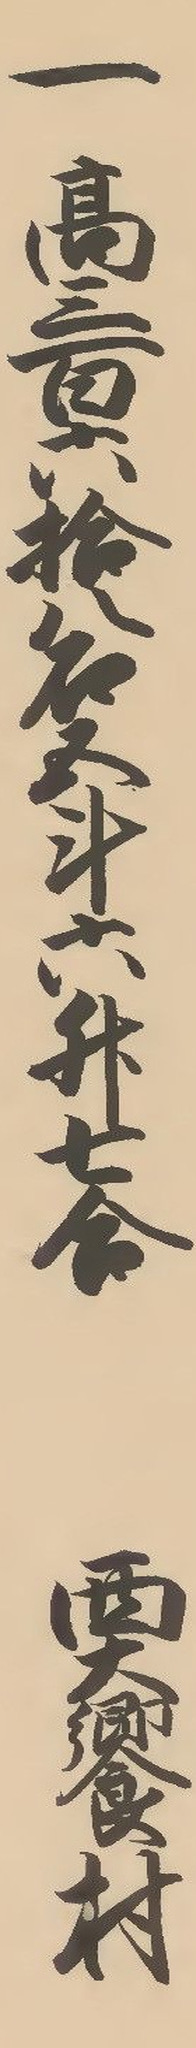一高三百六拾八石五斗六升七合西大饗村
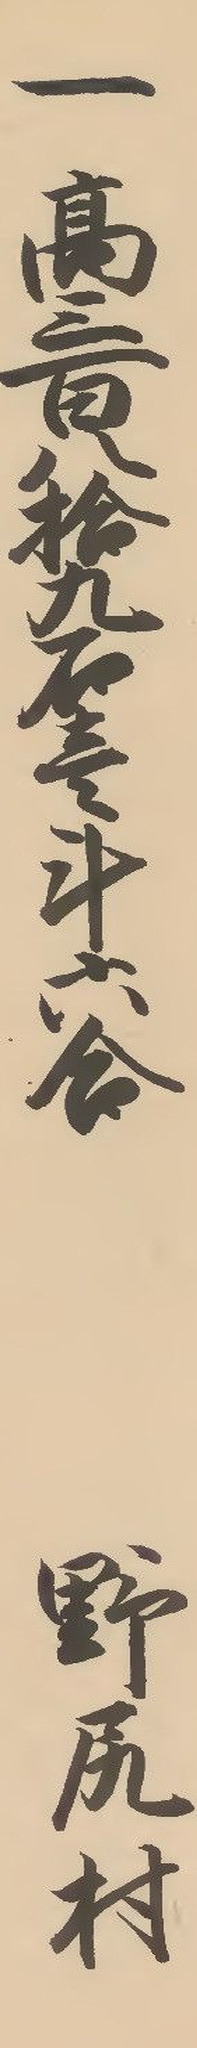一高三百八拾九石壱斗六合野尻村
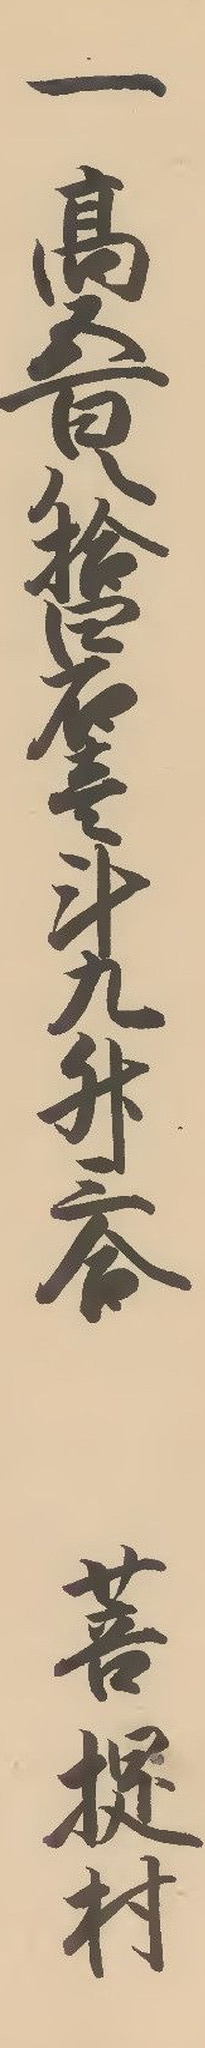一高五百八拾四石壱斗九升三合菩提村

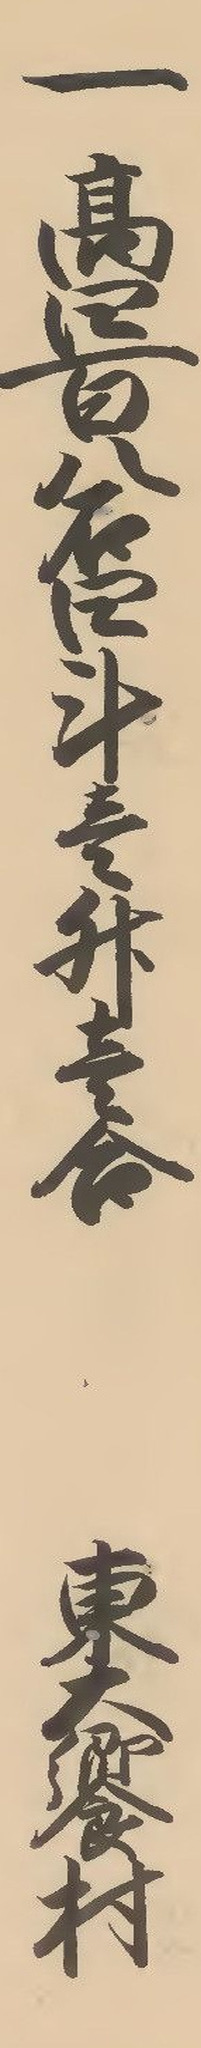一高四百八石四斗壱升壱合東大饗村
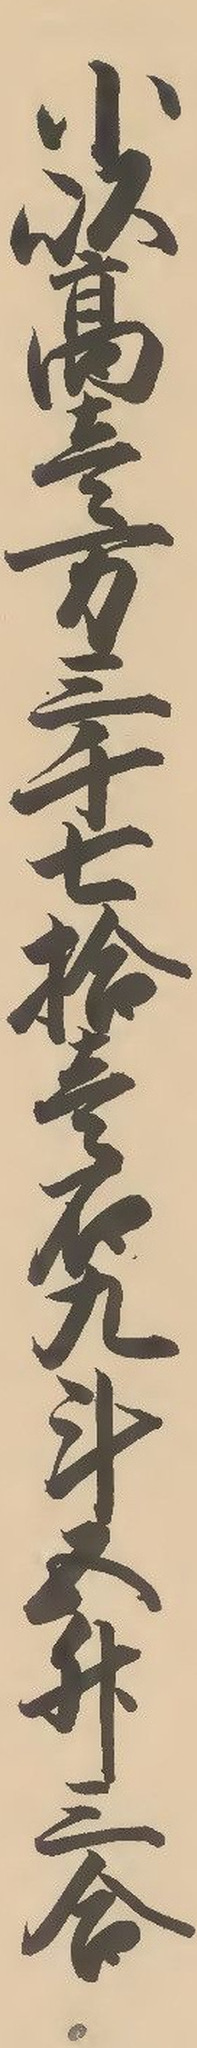小以高壱万三千七拾壱石九斗五升三合
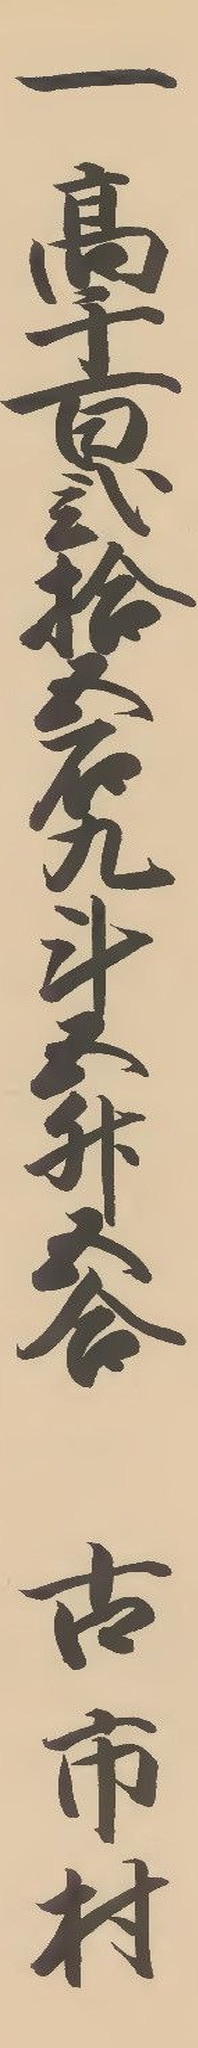一高千百弐拾五石九斗五升五合古市村
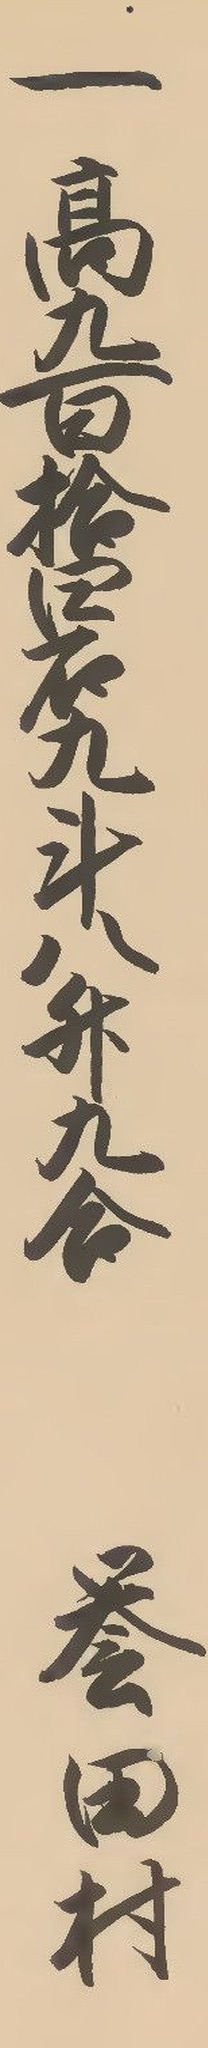一高九百拾四石九斗八升九合誉田村
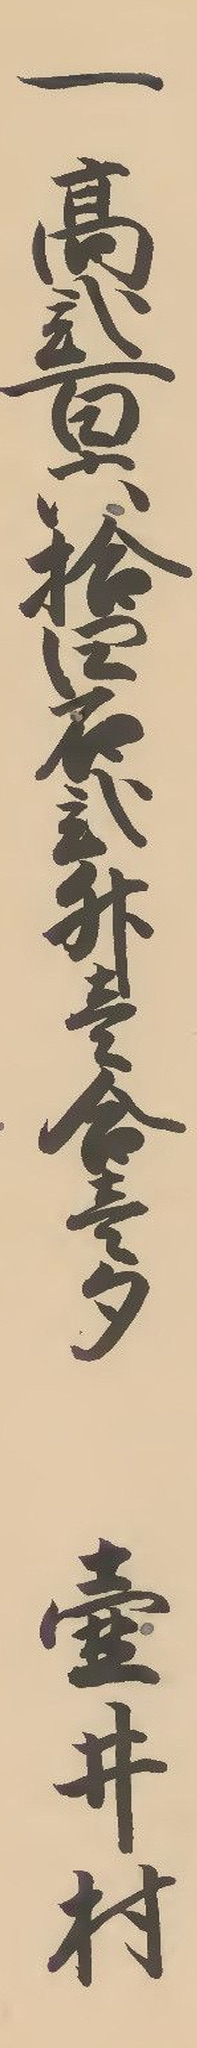一高弐百六拾四石弐升壱合壱勺壼井村

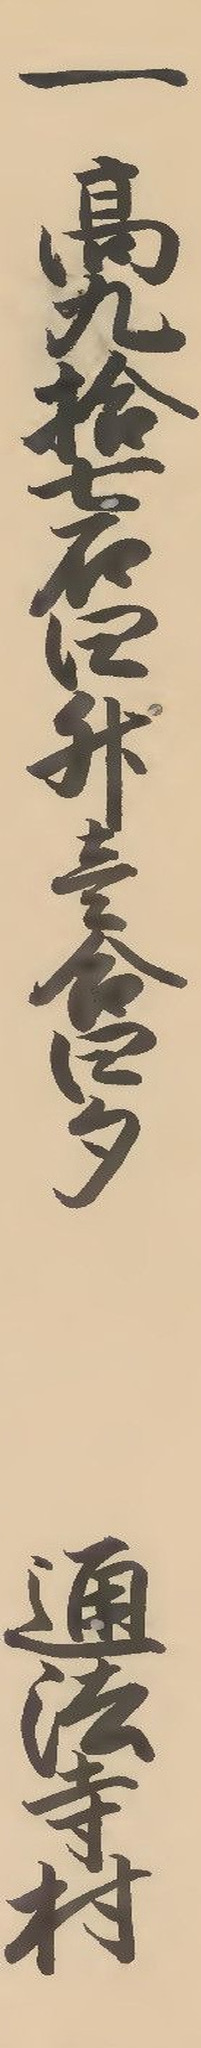一高九拾七石四升壱合四勺通法寺村
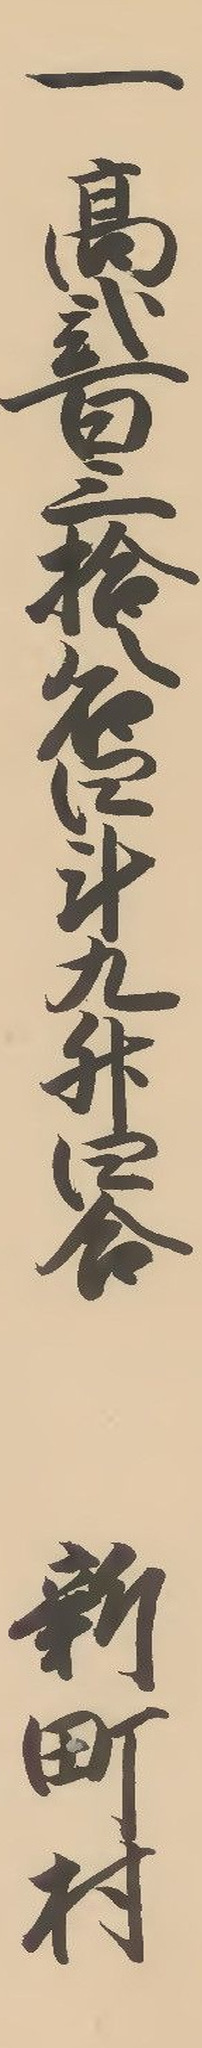一高弐百三拾八石四斗九升四合新町村
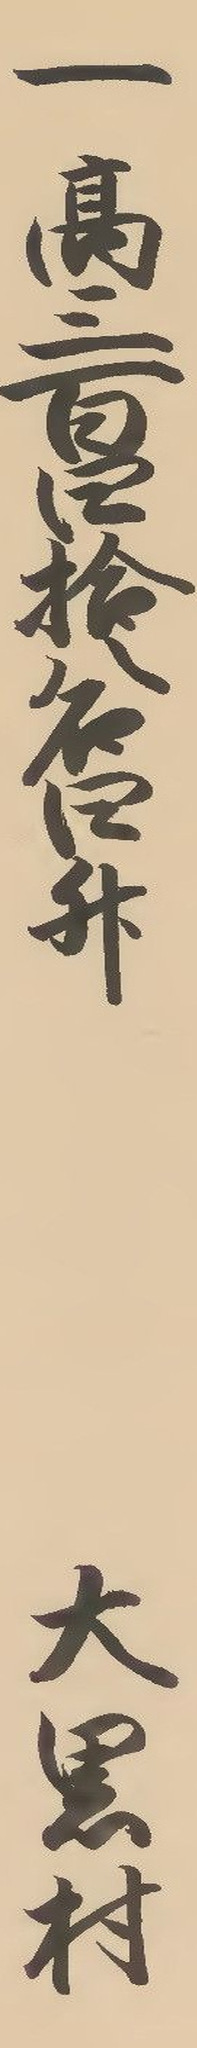一高三百四拾八石四升大黒村
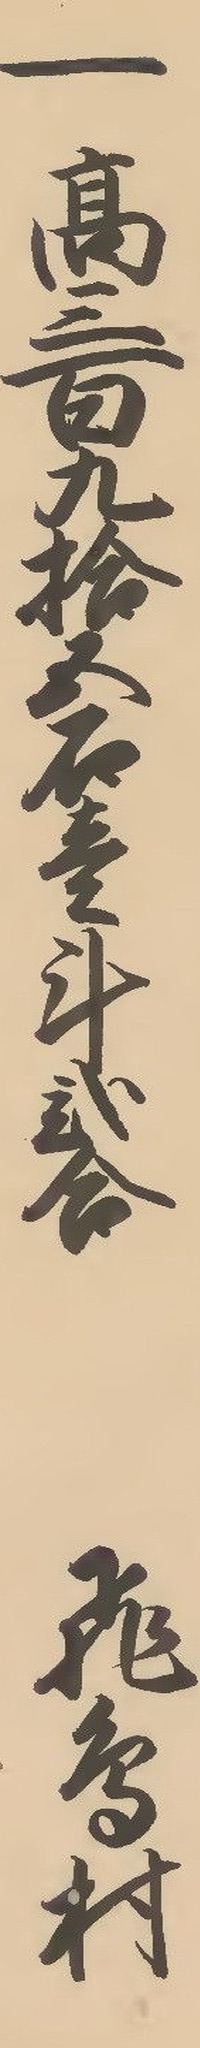一高三百九拾五石壱斗弐合飛鳥村
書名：河内国郷帳
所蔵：国立公文書館 National Archives of Japan
